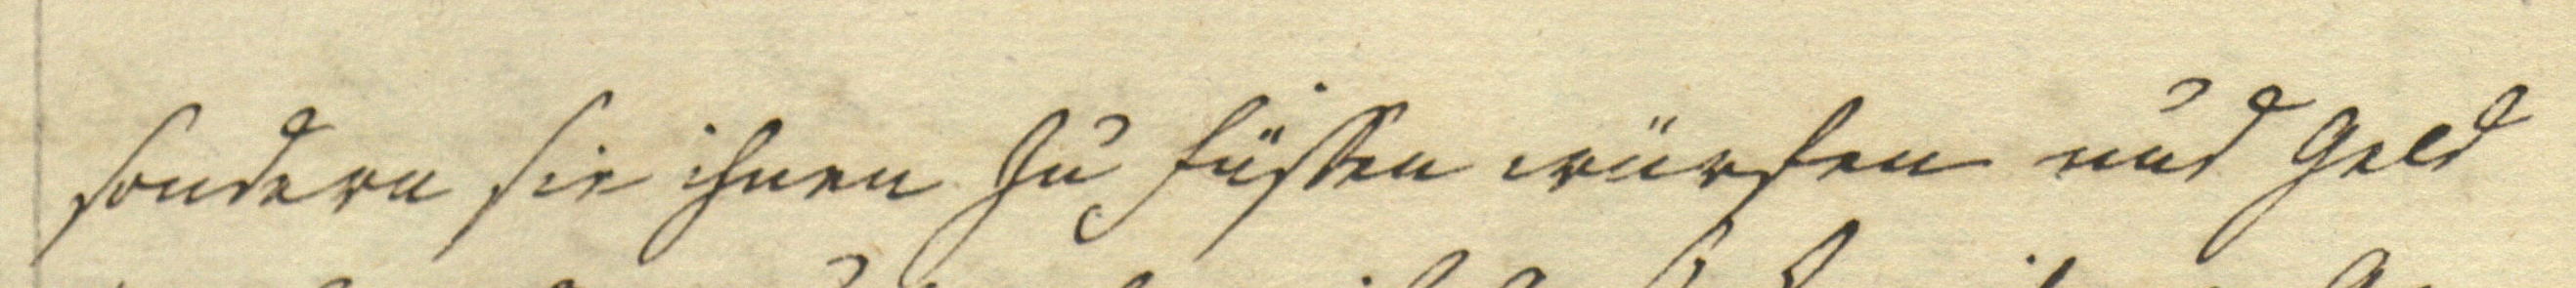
sondern sie ihnen zu Füssen würfen und Geld
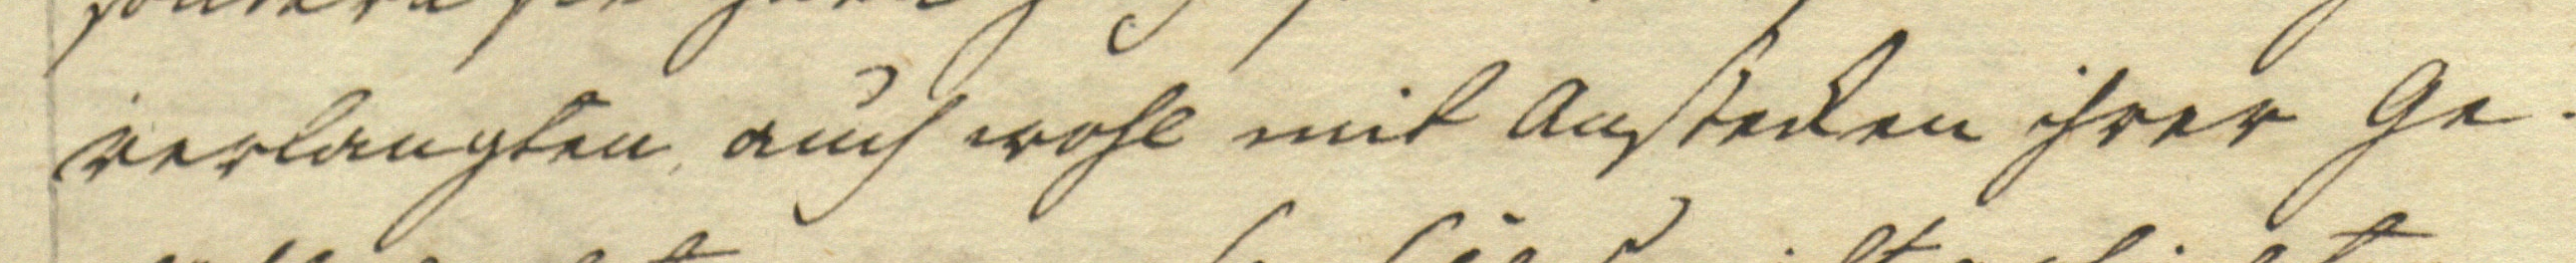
verlangten auch wohl mit Anstecken ihrer Ge¬
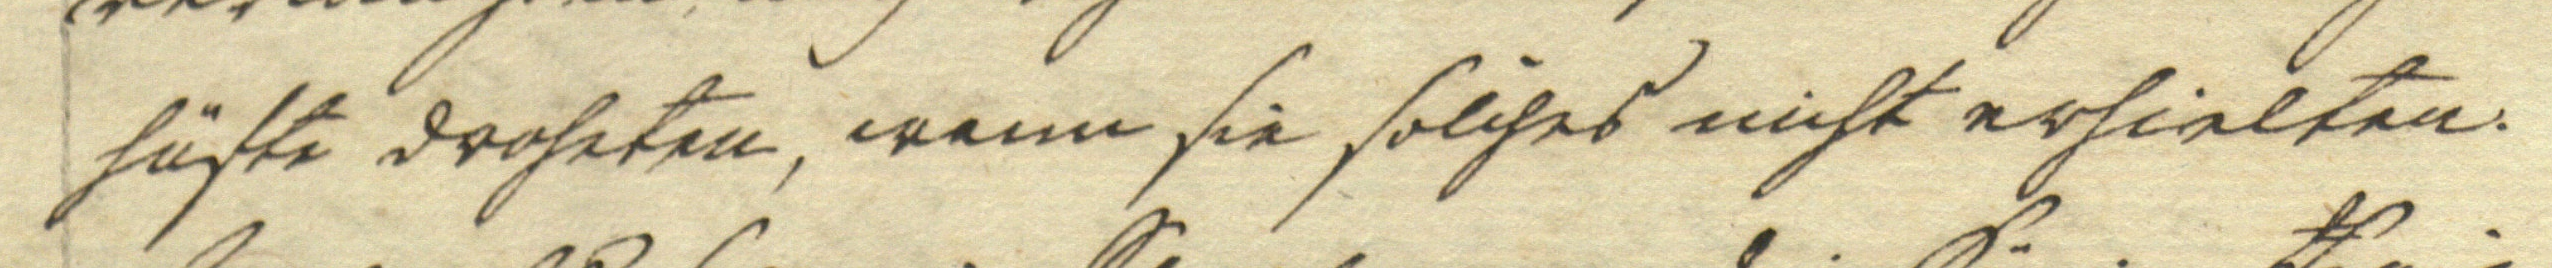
süfte droheten, wenn sie solches nicht erhielten.
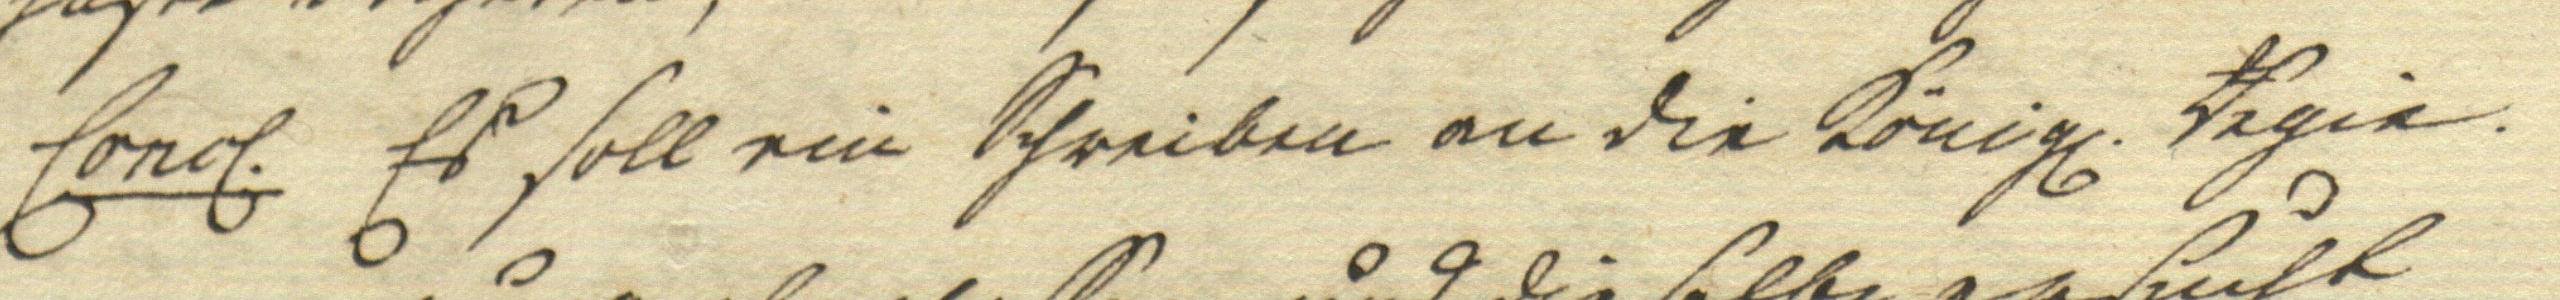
Concl. Es soll ein Schreiben an die Königl. Regie¬
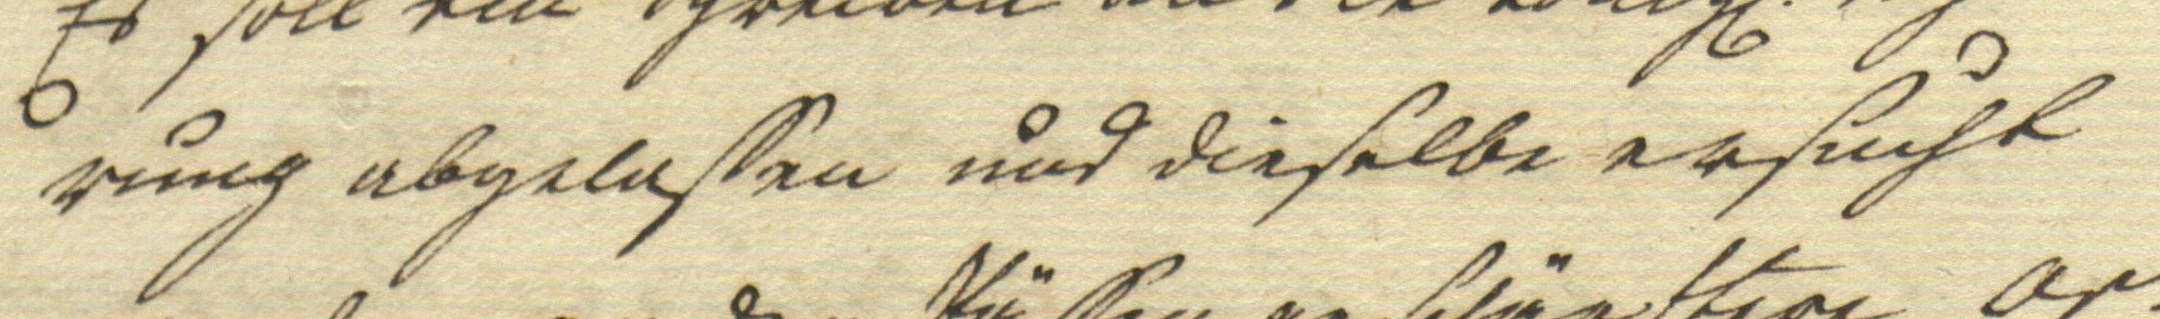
rung abgelassen und dieselbe ersucht
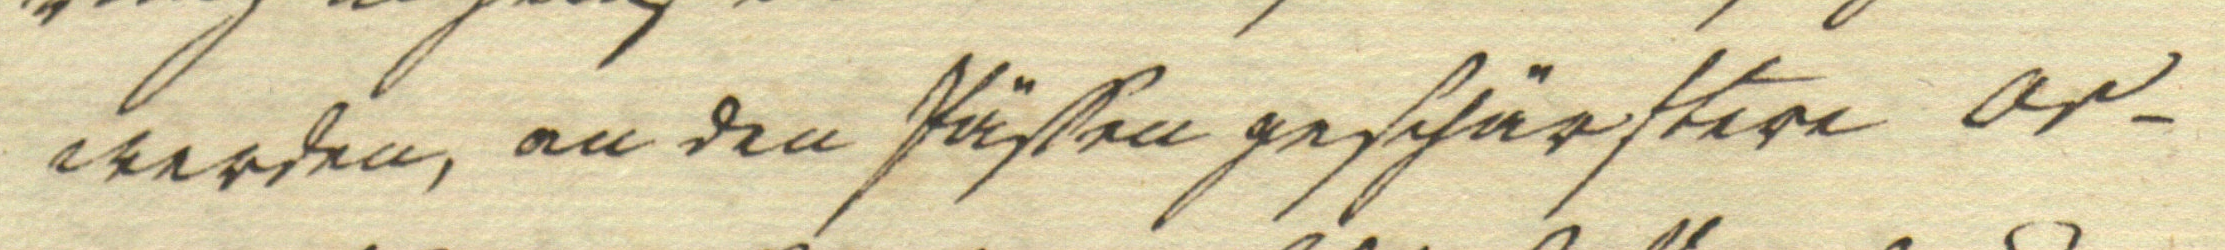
werden, an den Pässen geschärftere or¬
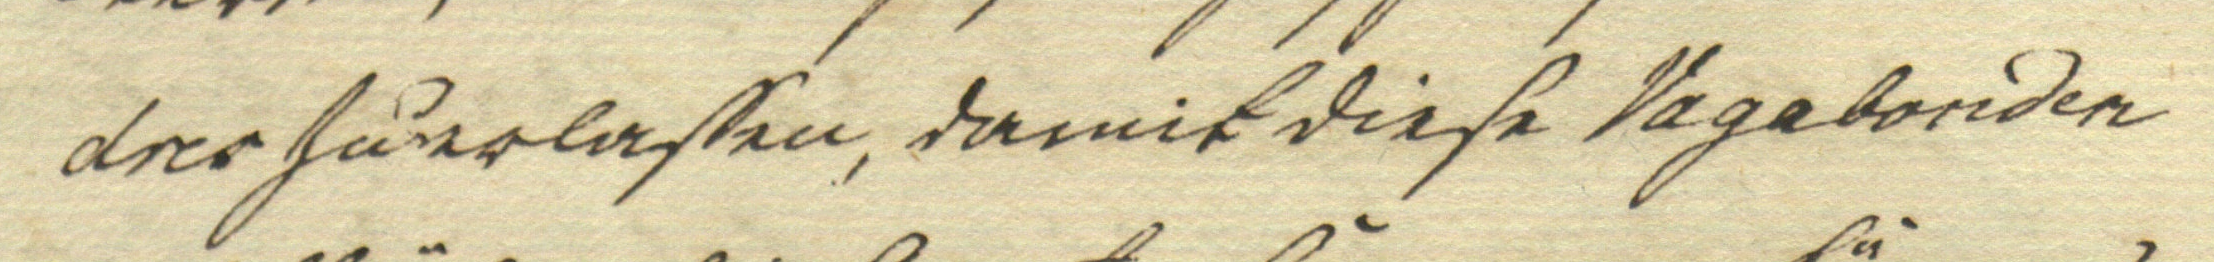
dres zuerlassen, damit diese Vagabonden
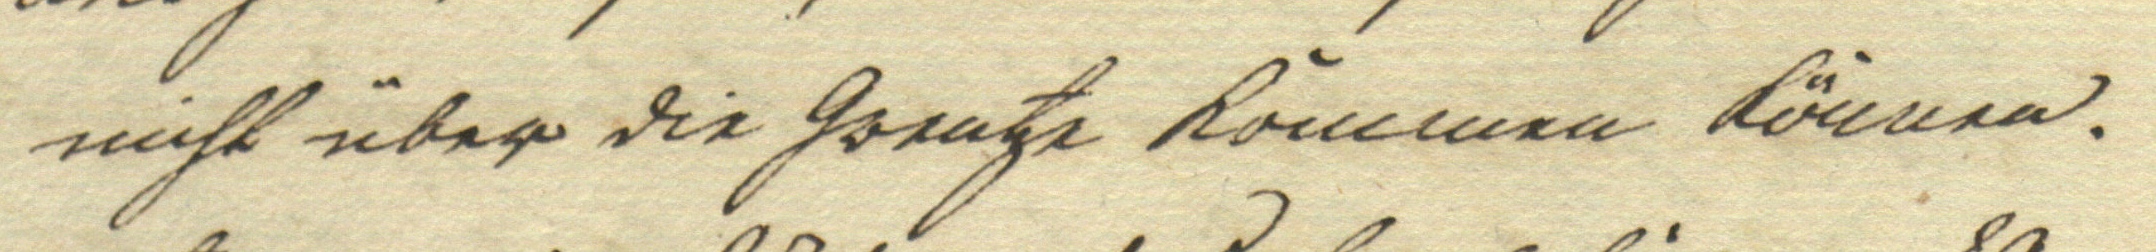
nicht über die Grentze kommen können.
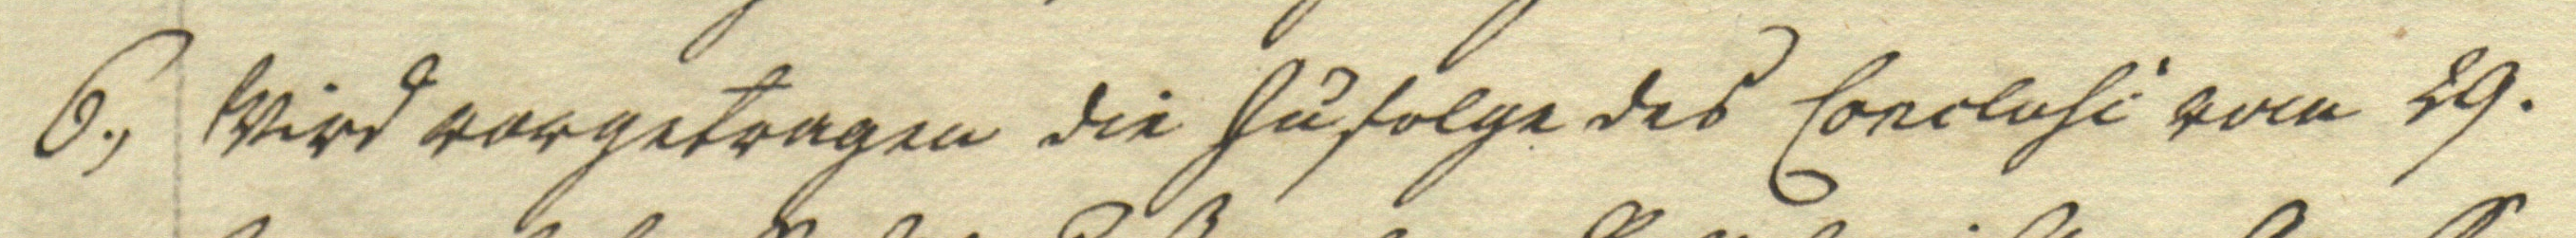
6., Wird vorgetragen die zufolge des Conclusi vom 29.
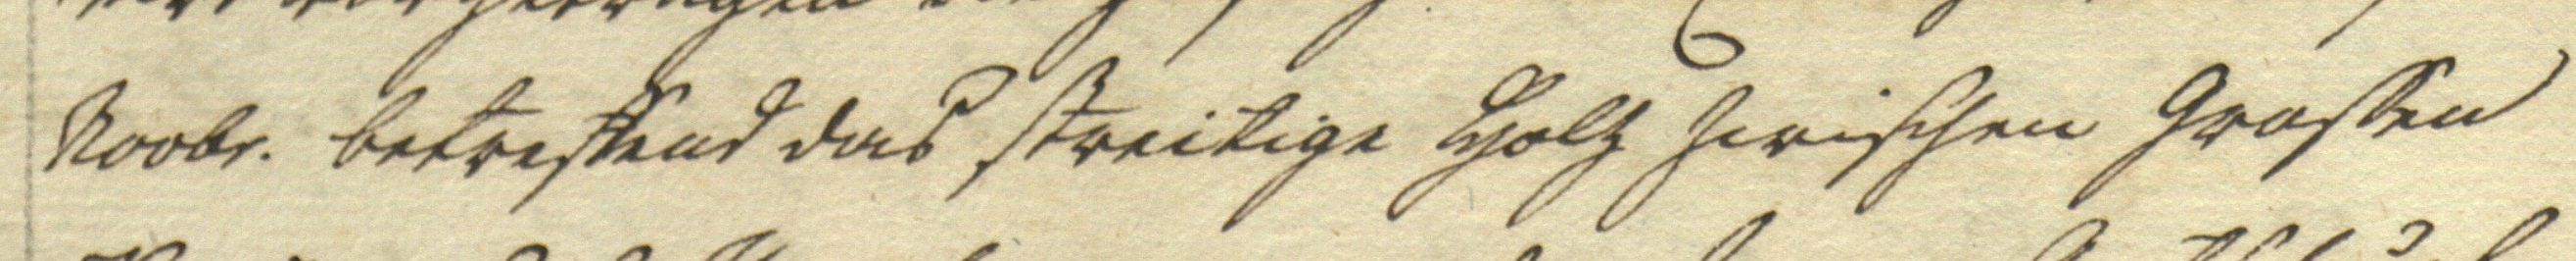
Novbr. betreffend das streitige Holz zwischen Grossen
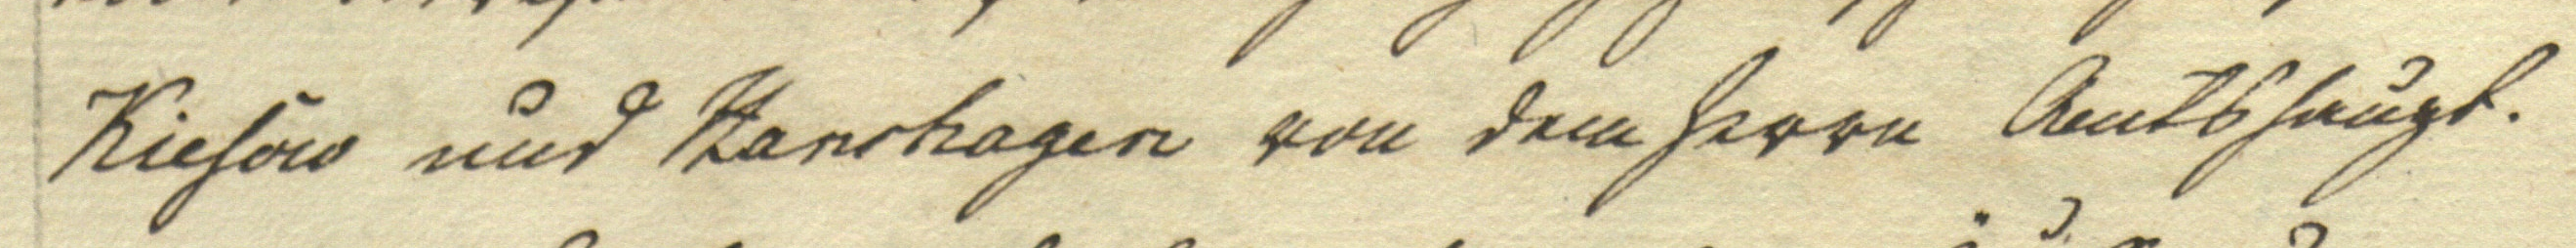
Kiesow und Hanshagen von dem Herrn Amtshaupt¬
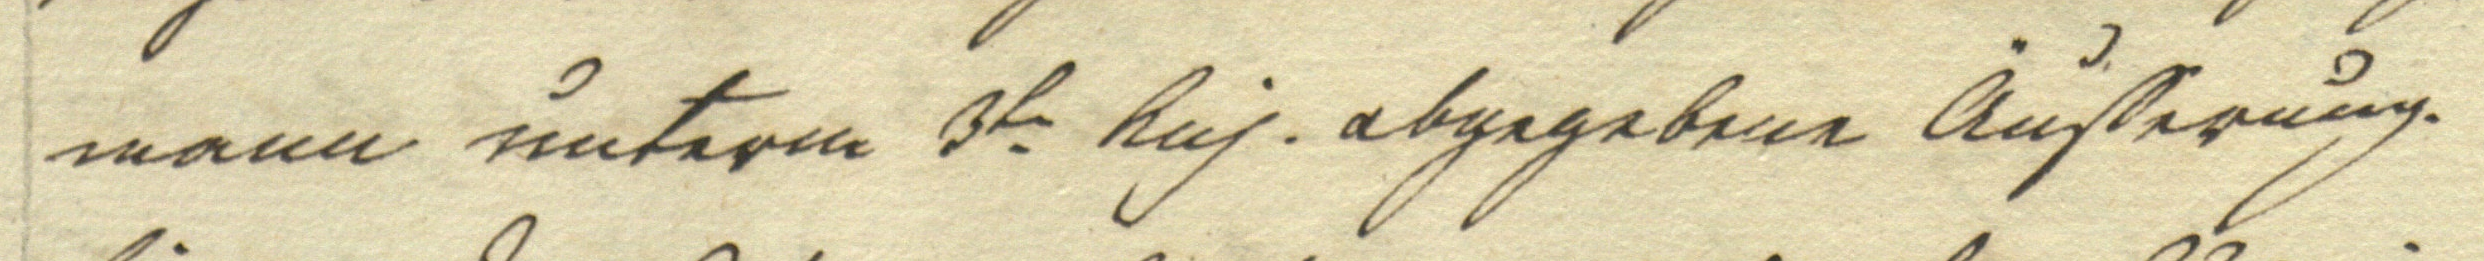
mann unterm 3 t huj. abgegebene Äusserung.
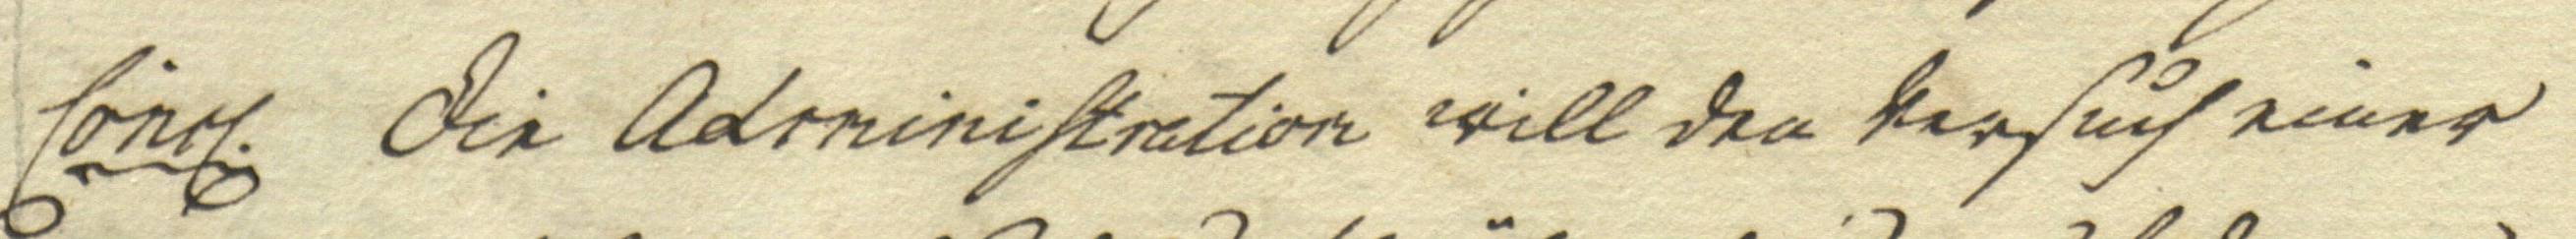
Concl. Die Administration will den Versuch einer
